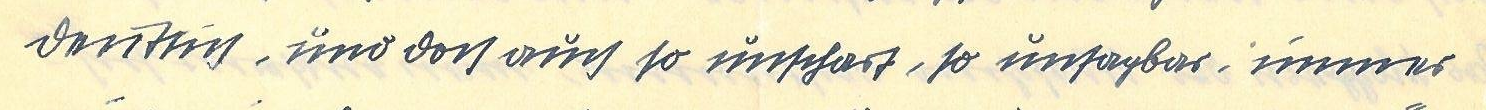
deutlich, und doch auch so unscharf, so unsagbar immer
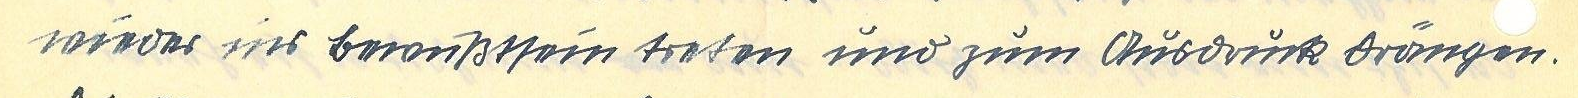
wieder ins Bewußtsein treten und zum Ausdruck drängen.
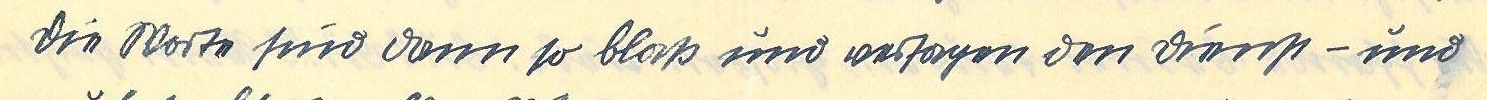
Die Worte sind dann so blaß und versagen den Dienst – und
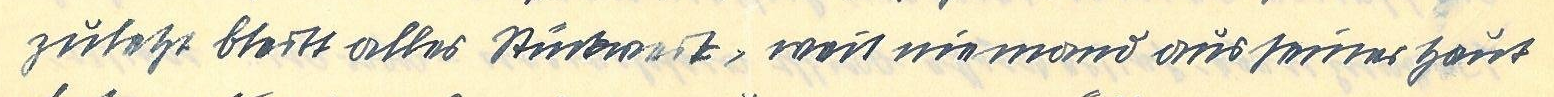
zuletzt bleibt alles Stückwerk, weil niemand aus seiner Haut¬
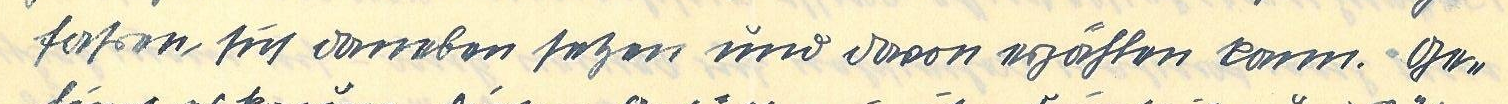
fahren, sich daneben setzen und davon erzählen kann. Ge¬
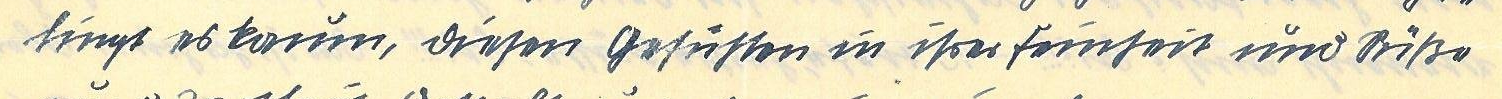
lingt es kaum, diesen Gefühlen in ihrer Feinheit und Süße
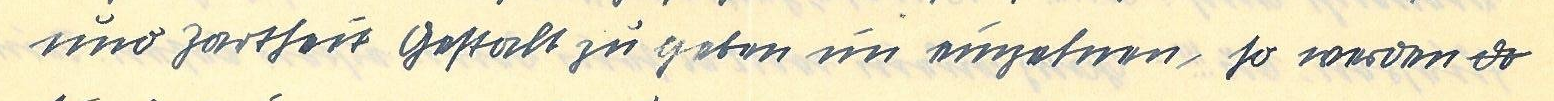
und Zartheit Gestalt zu geben im einzelnen, so werden do
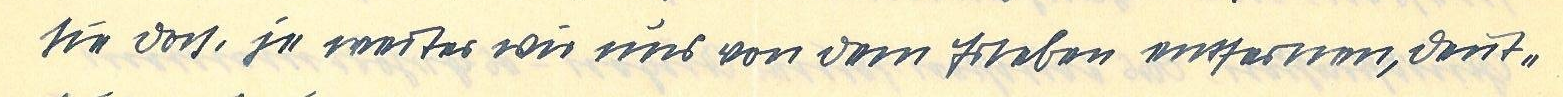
sie doch, je weiter wir uns von dem Erleben entfernen, deut¬
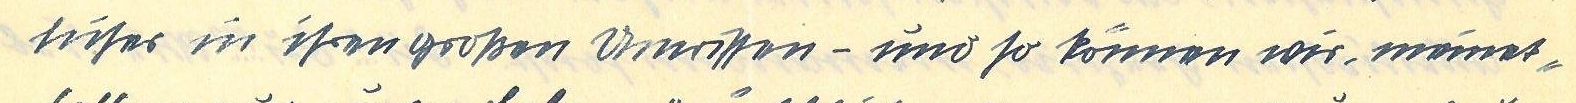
licher in ihren großen Umrissen – und so können wir, meinet¬
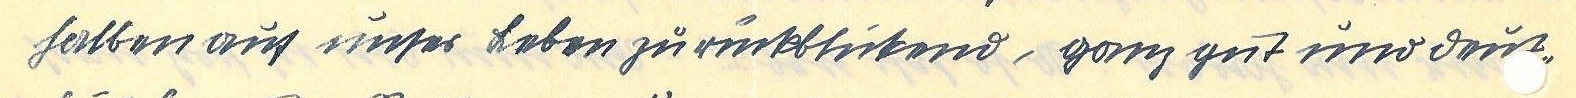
halben auf unser Leben zurückblickend, ganz gut und deut¬
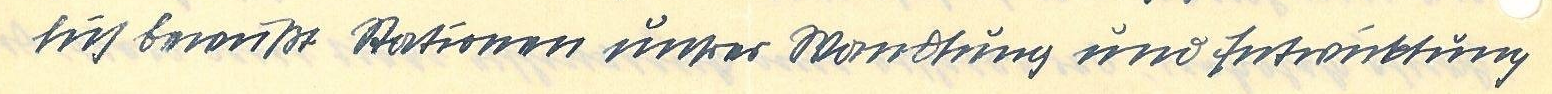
lich bewußt Stationen unserer Wandlung und Entwicklung
